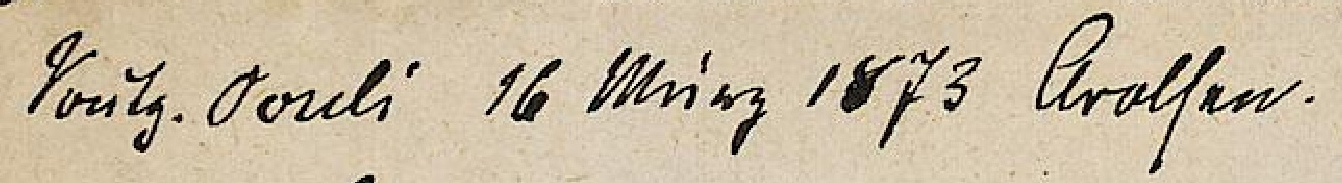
Sontg. Oculi 16 März 1873 Arolsen.
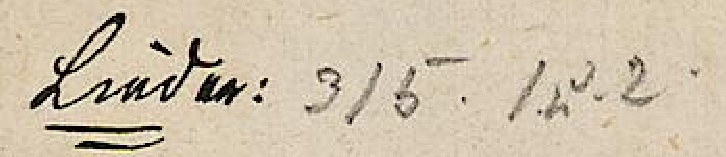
Lieder: 315,.1.u.2.
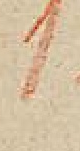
1
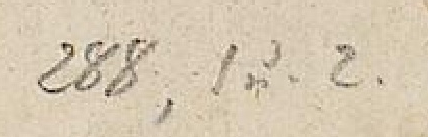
288,1u.2
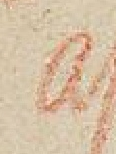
a)
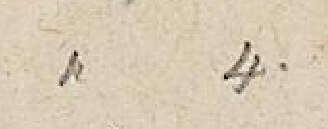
" 5
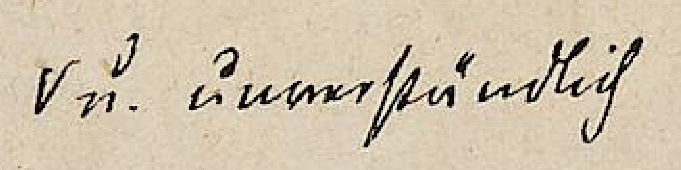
V. u. unverständlich
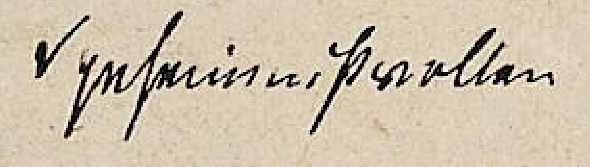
V geheimnisvollen
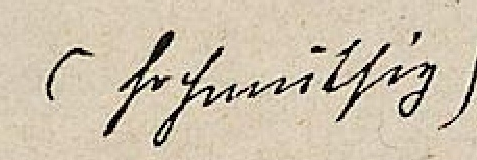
(hochmüthig)
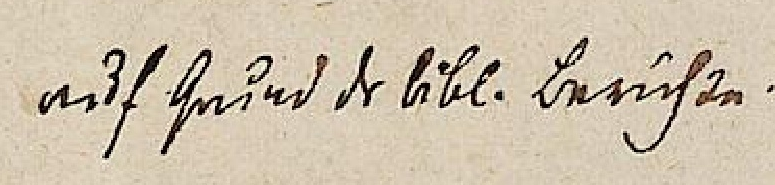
auf Grund der bibl. Berichte
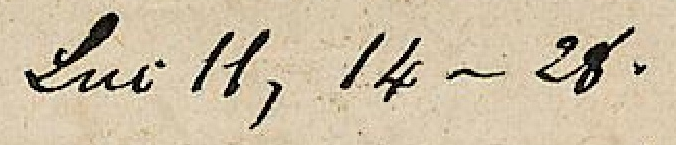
Luc 11, 14-28.
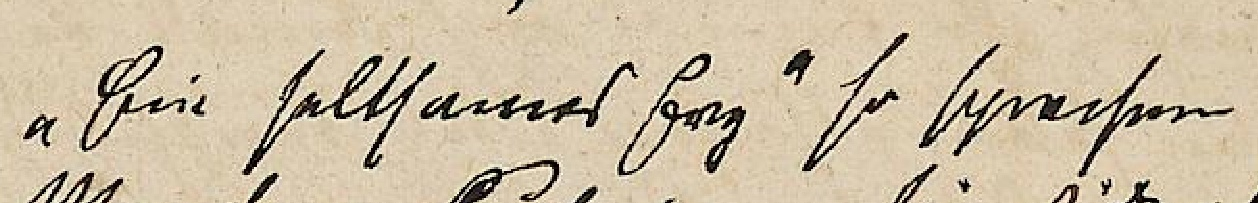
"Ein seltsames Erz" so sprachen
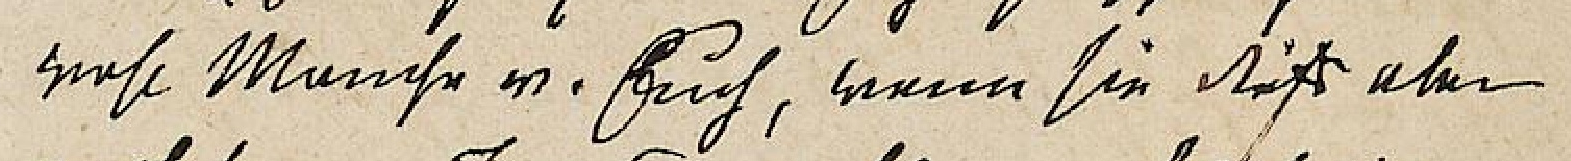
wohl Manche v. Euch, wenn sie dies eben
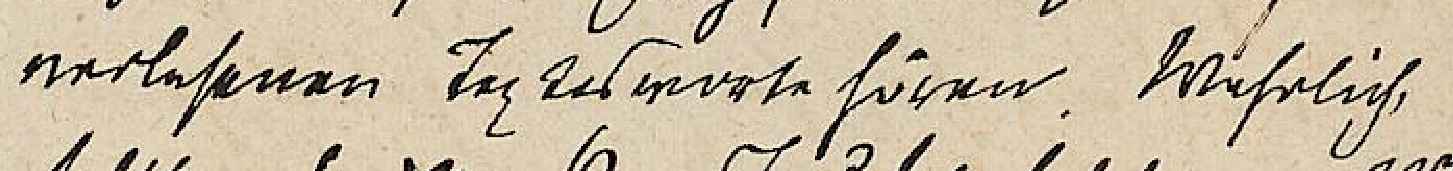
verlesene Textworte hören. Wahrlich,
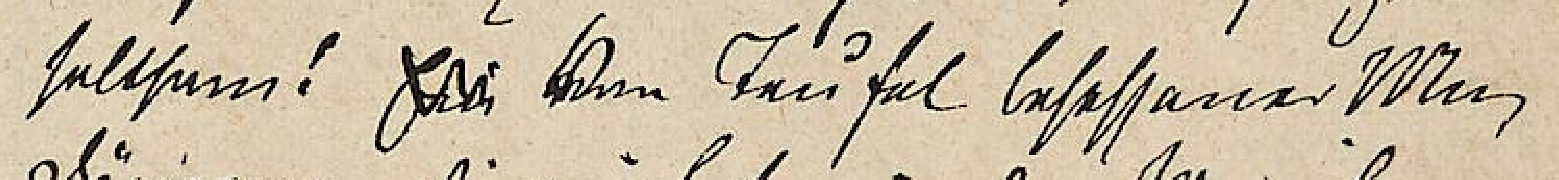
seltsam! Ein Vom Teufel besessene Mn,
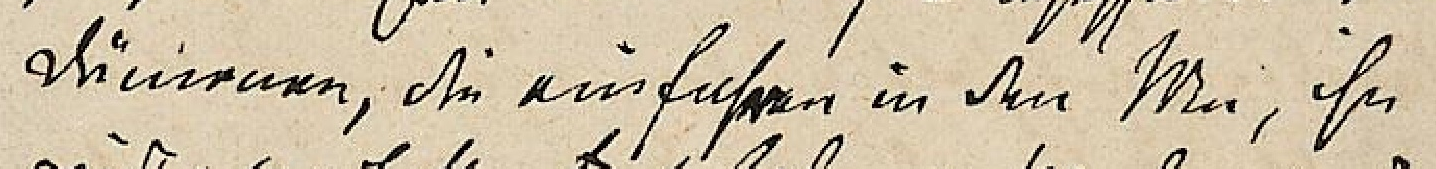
Dämonene, die einfahren in den Men, ihn
